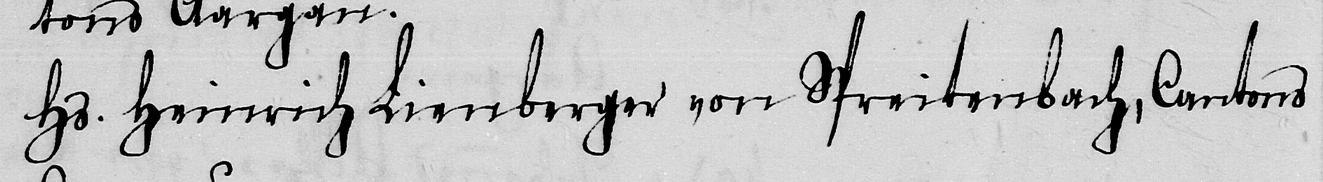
Hs. Heinrich Lienberger von Spreitenbach, Cantons
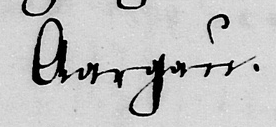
Aargau.
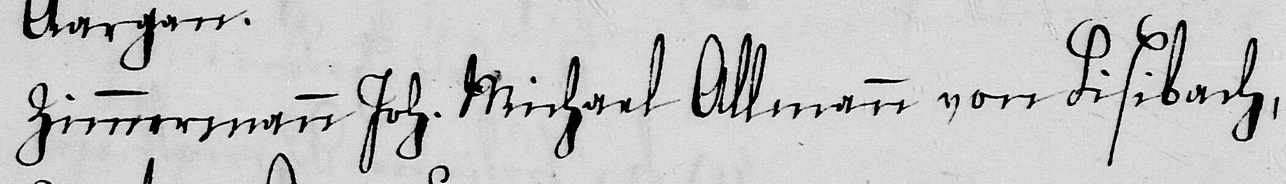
Zimmermann Joh. Michael Allmann von Fisibach,
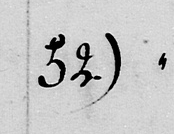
52.)
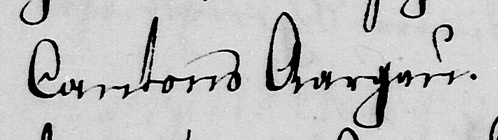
Cantons Aargau.
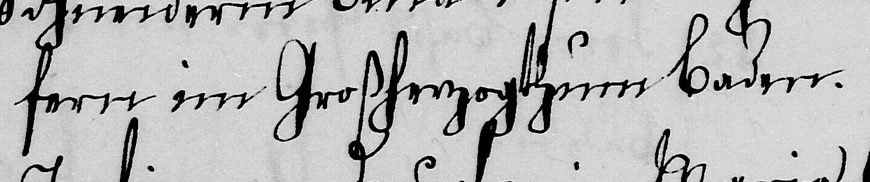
fern im Großherzogthum Baden.
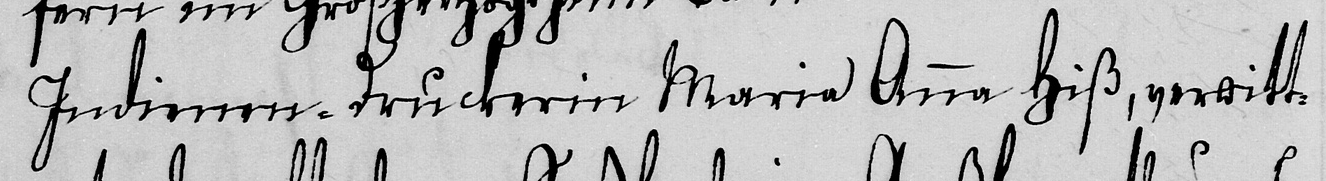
Indienen-Druckerin Maria Anna Hiß, verwitt¬
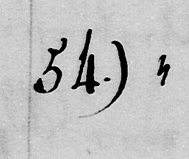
54.)
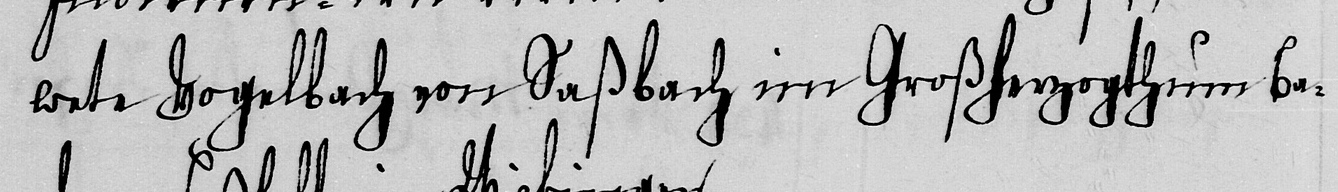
wete Vogelbach von Saßbach im Groherzogthum Ba¬
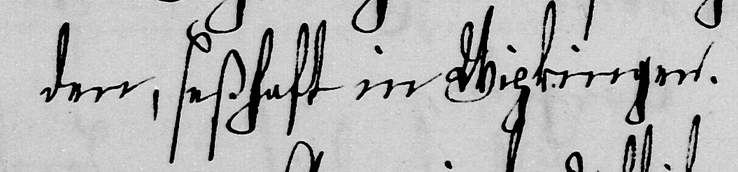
den, seßhaft in Wipkingen.
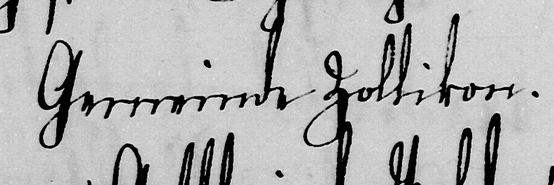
Gemeinde Zollikon.
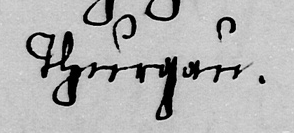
Thurgau.
